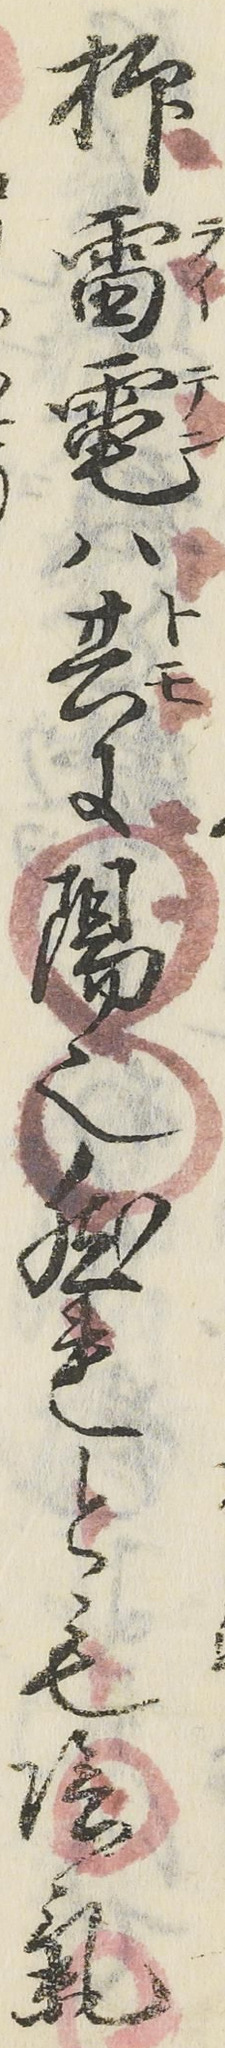等雷電は共に陽也然れとも陰気
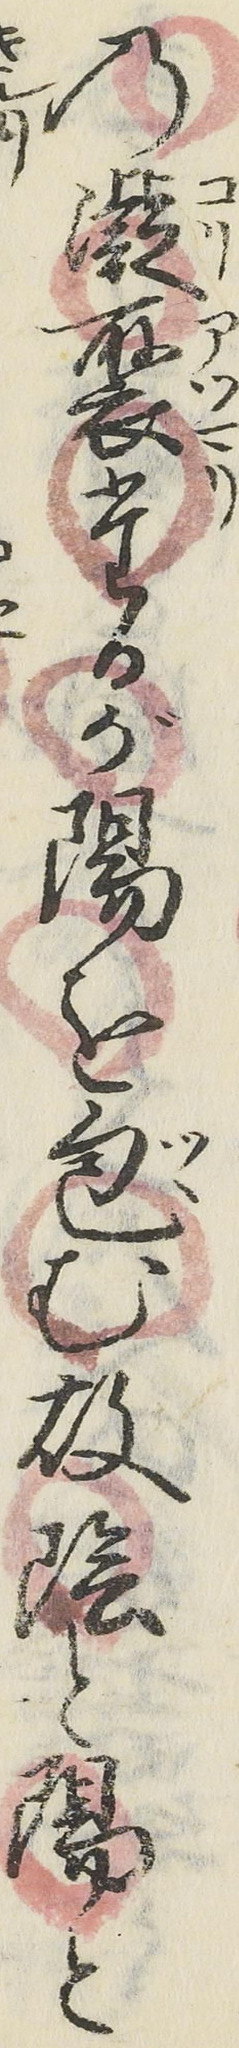の凝聚たるが陽を包む故陰と陽と
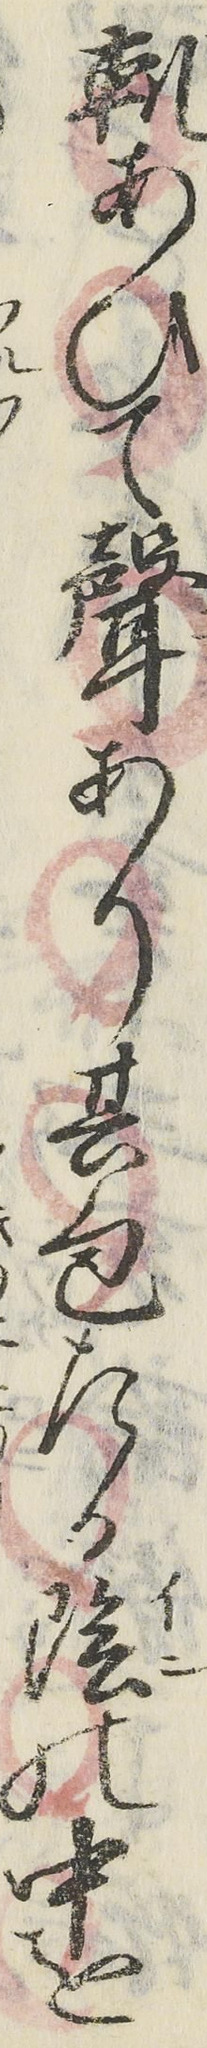軋あひて声あり其包たる陰の中を
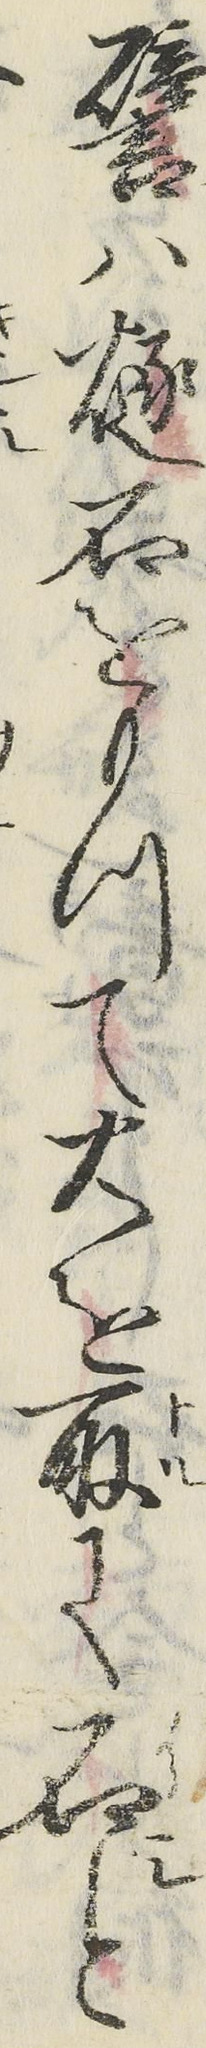譬は燧石をもつて火を取に石と
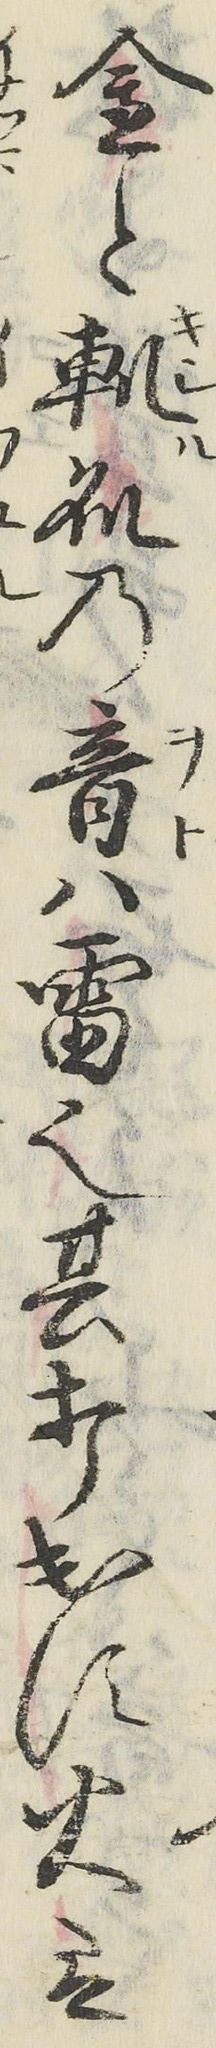金と軋処の音は雷の其打出す火は
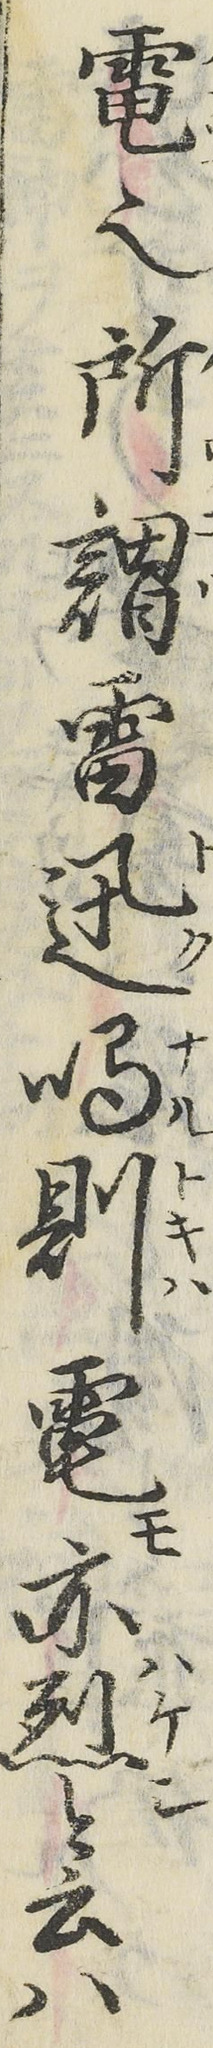電の所謂雷迅鳴則電も亦烈と云は

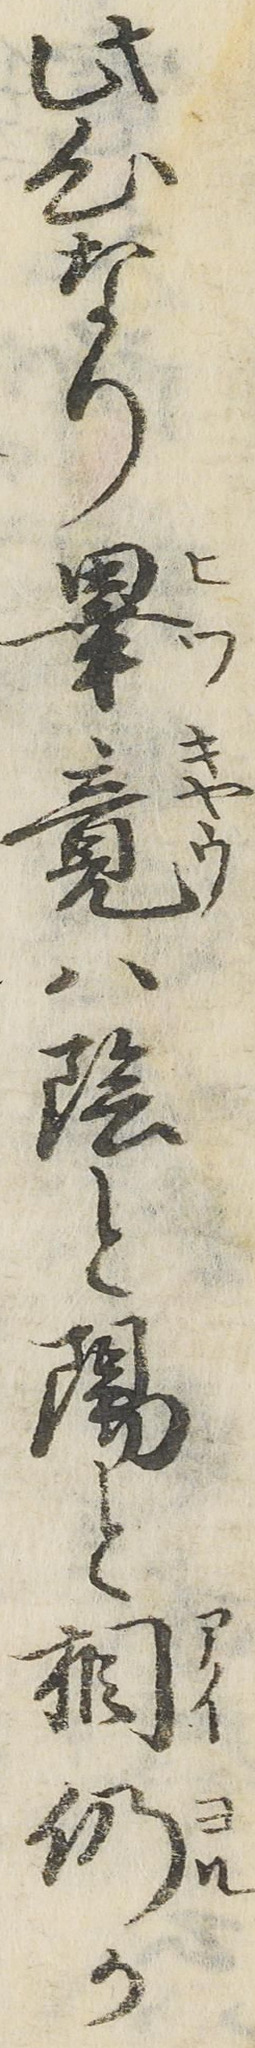此心なり畢竟は陰と陽と相仍か
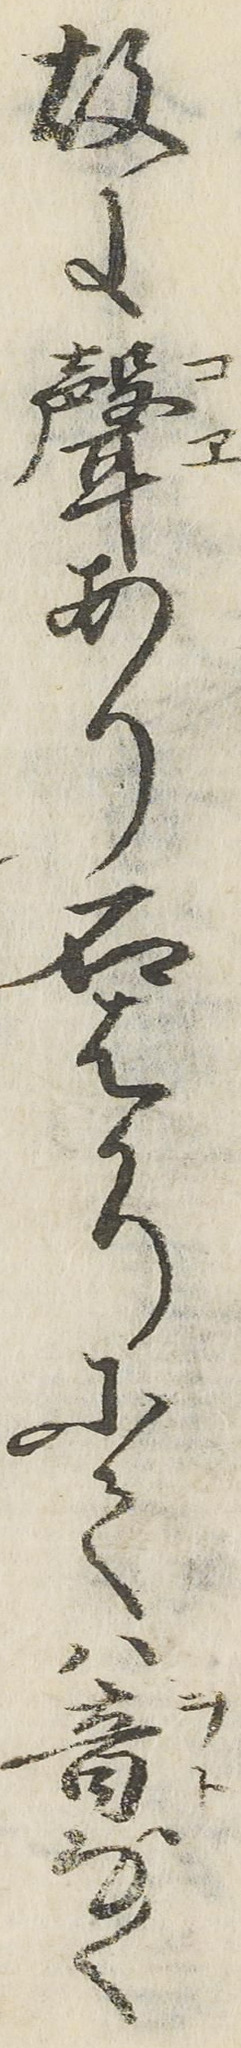故に声あり石はかりにては音なく
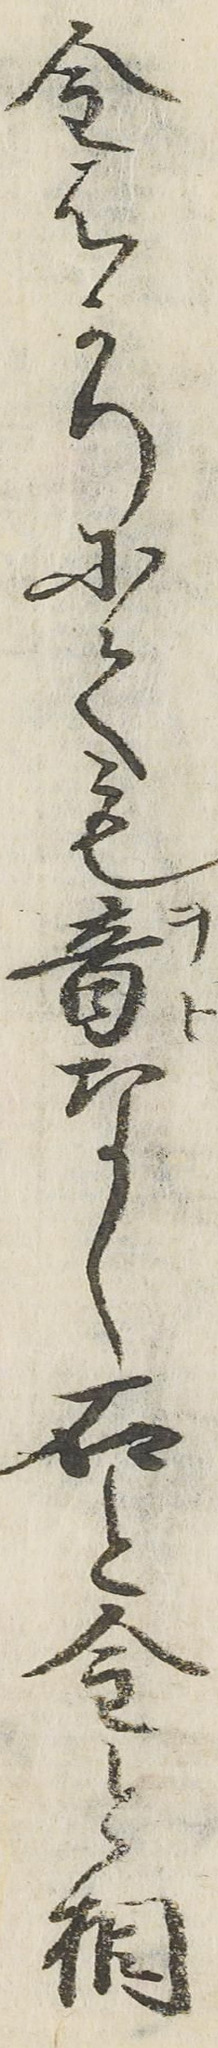金はかりにても音なし石と金と相
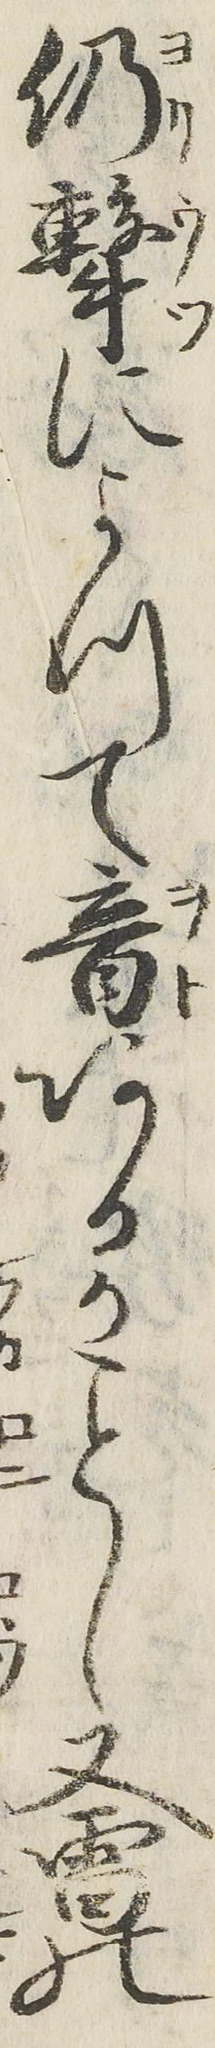仍撃によつて音あるかことし又雷の
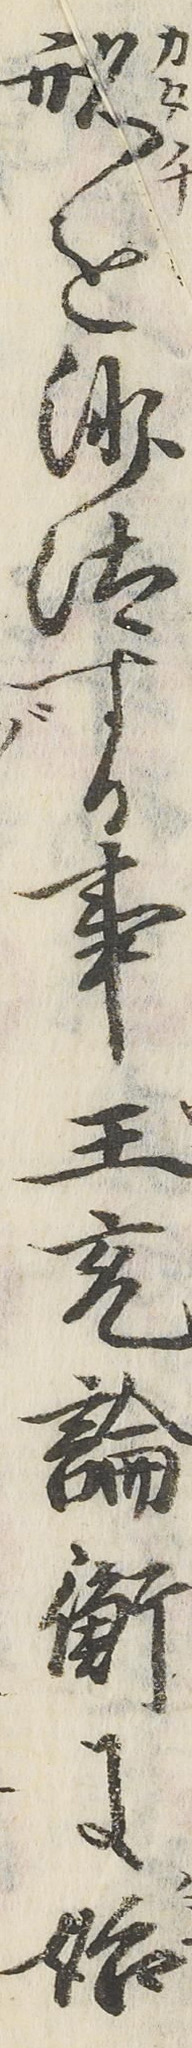形を沙汰する事王充論衡に始
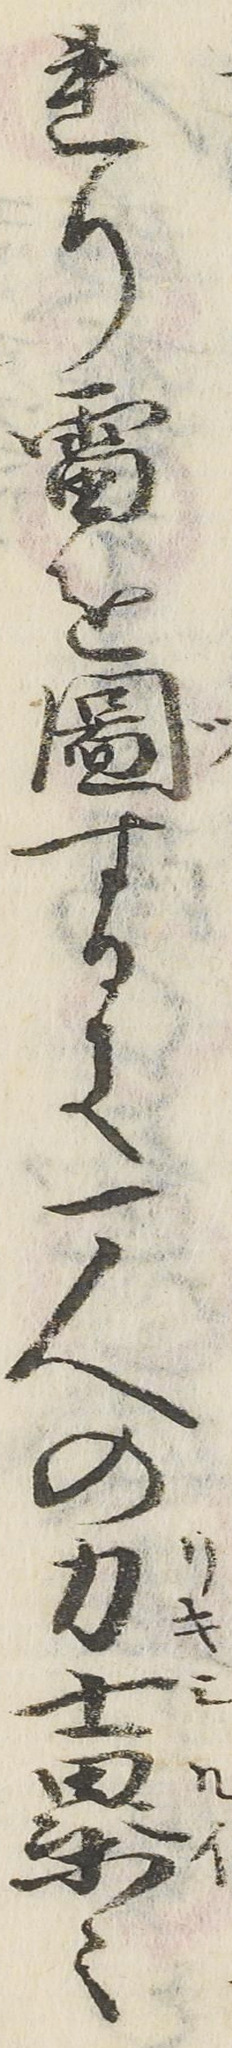れり雷を図するに一人の力士累々
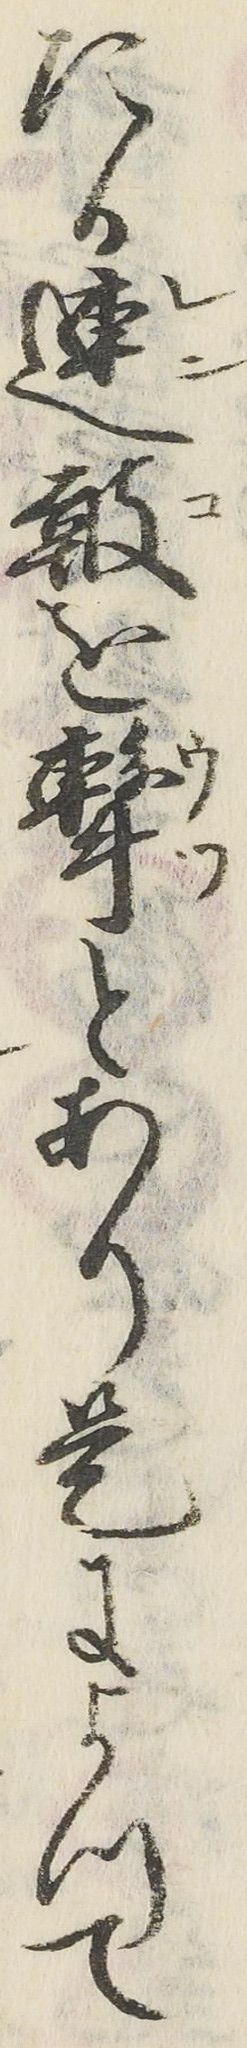たり連鼓を撃とあり是によつて
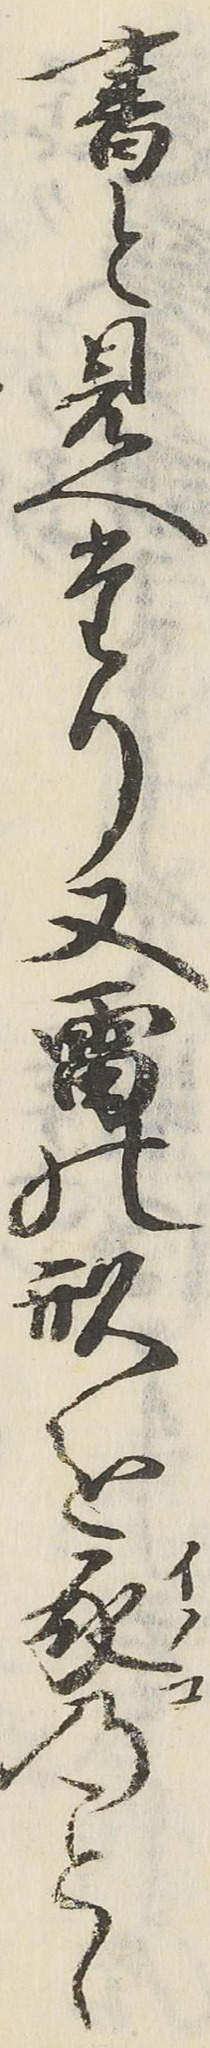書と見へたり又雷の形を豕のことし
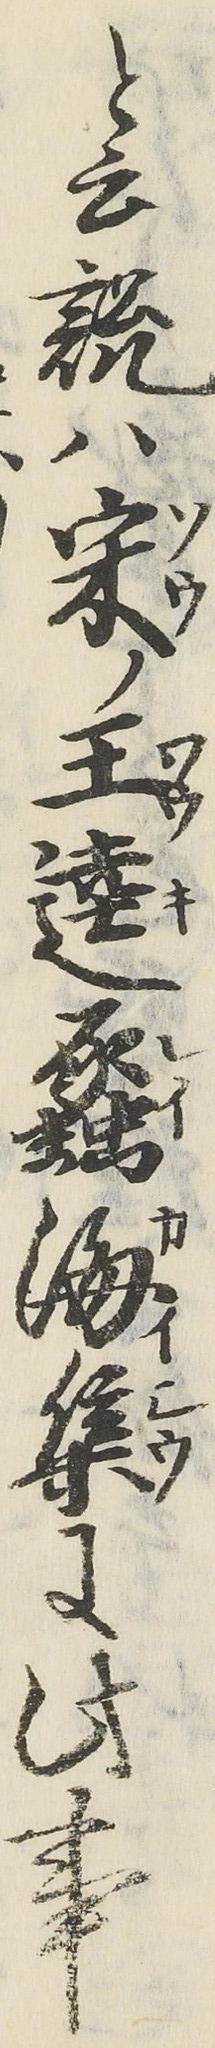と云説は宗の王逵蟸海集に此事
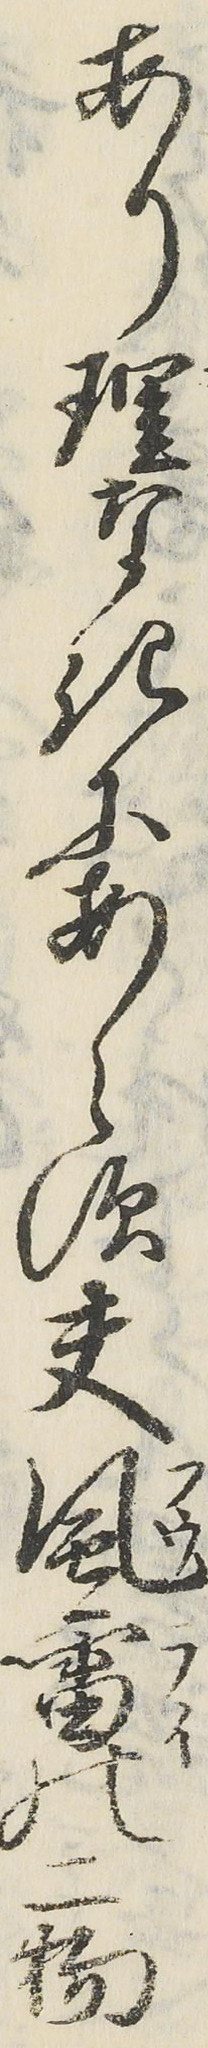あり理なきにあらす夫風雷の二物
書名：天地或問珍　天
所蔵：東京大学地震研究所図書室 Earthquake Research Institute Library, The University of Tokyo, JAPAN
